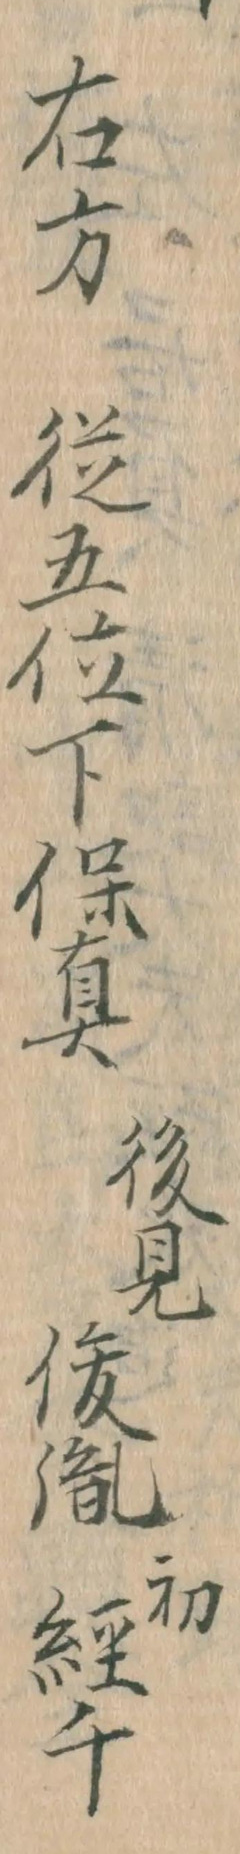左方従四位下保真後見俊胤経千
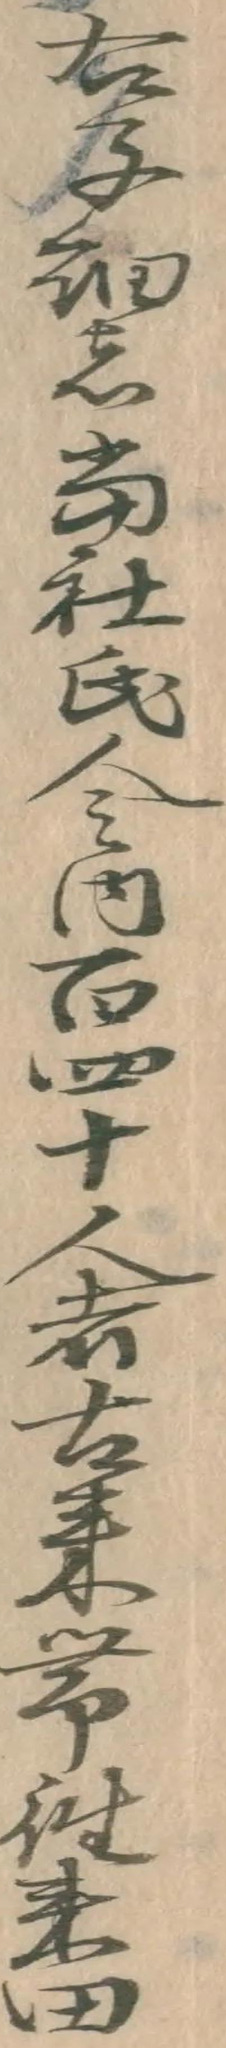右子細者当社氏人之内百四十人者古来帯往来田
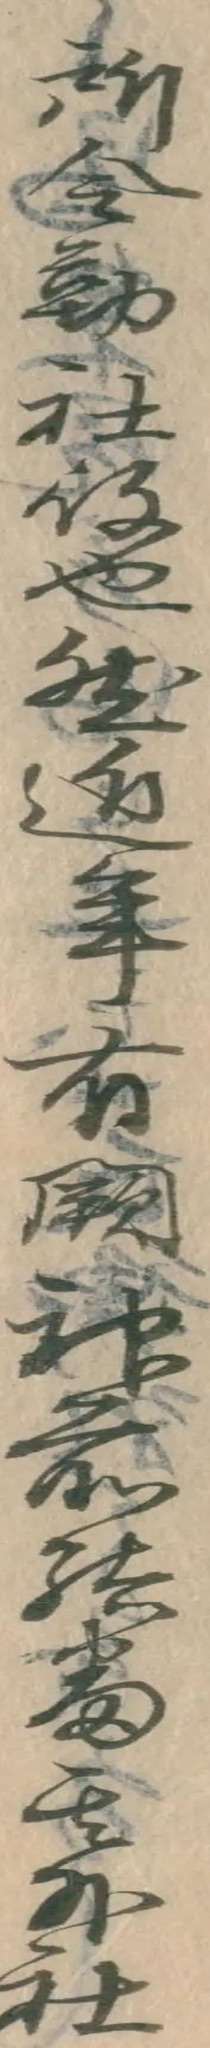所令勤社役也然近年有闕神前結番其外社
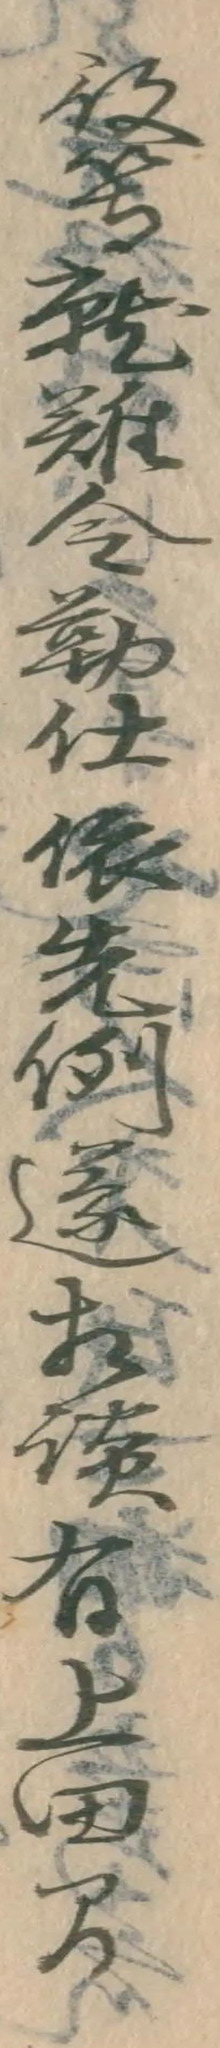役等就難令勤仕依先例遂相談有上田間
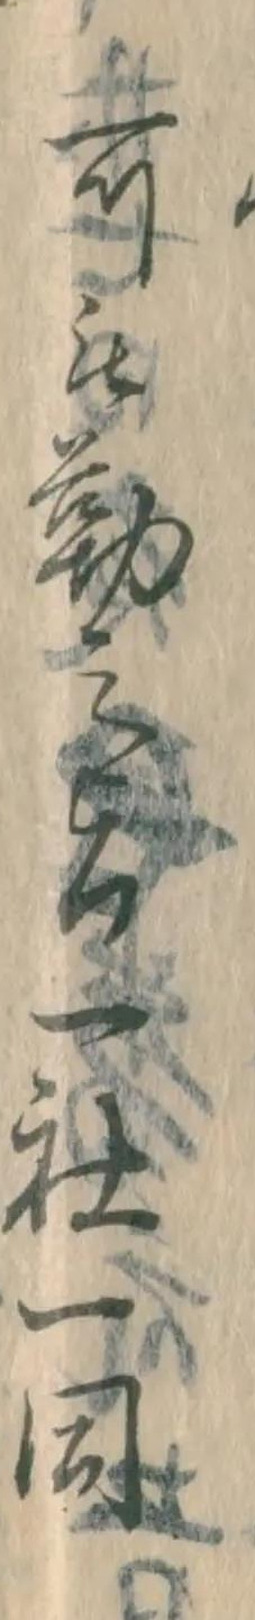可被勤之旨一仕一同

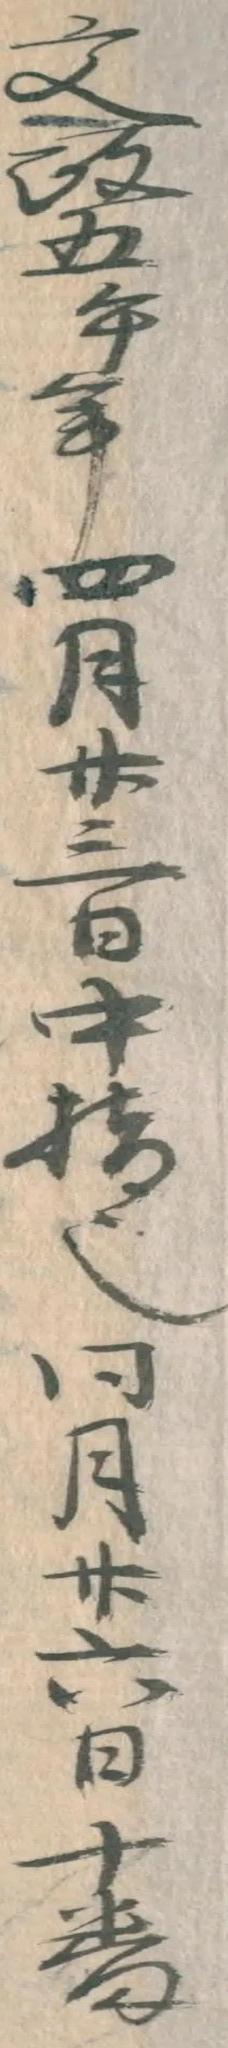文政五午年四月廿三日中指也同月廿六日十番
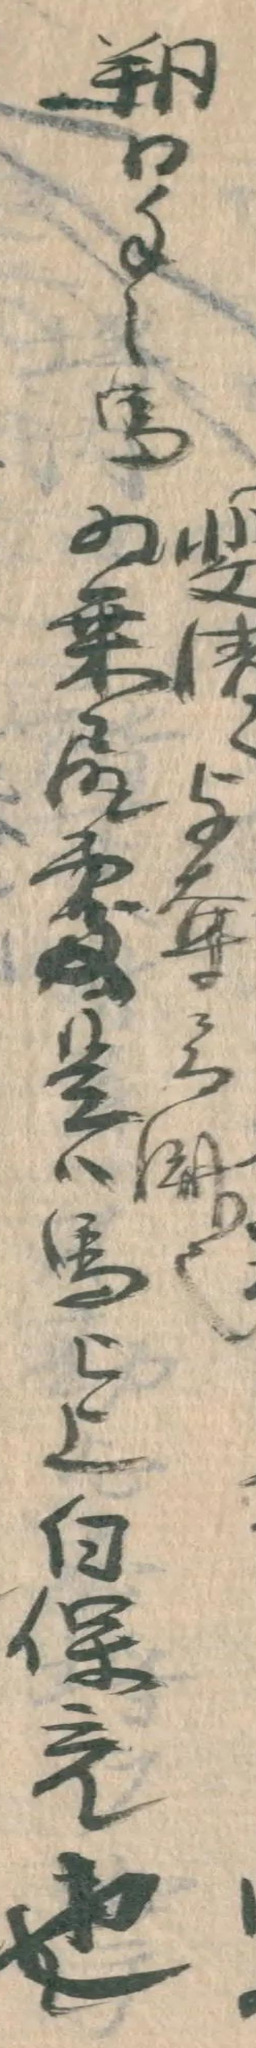朔日年之馬為乗尻処是ハ馬被上白保衣也
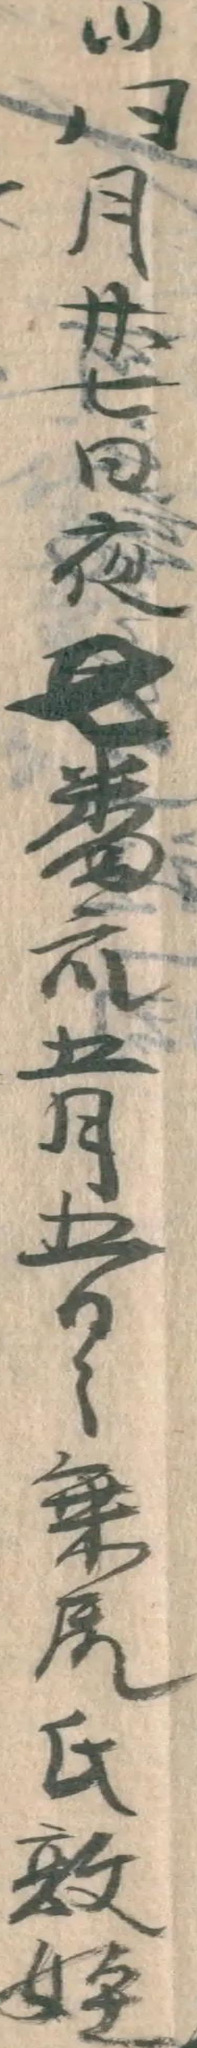亦同月廿七日夜七番衆五月五日之乗尻氏敦姪
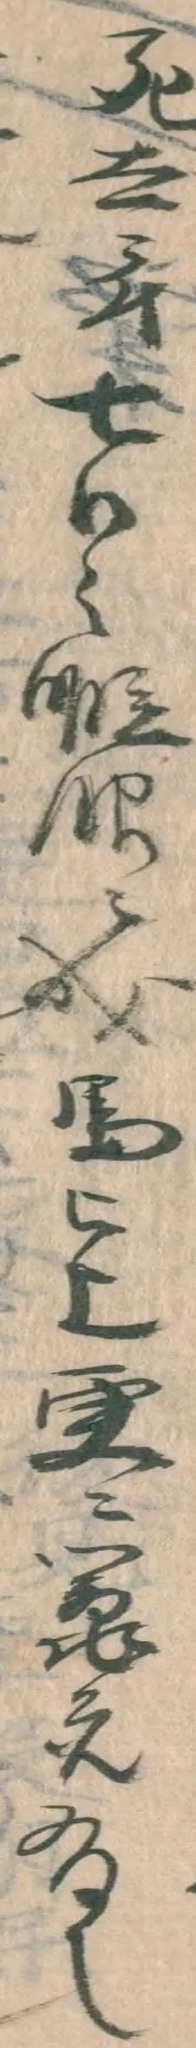死去ニ付七日之暇師ニ成馬被上更ニ御亀取有之
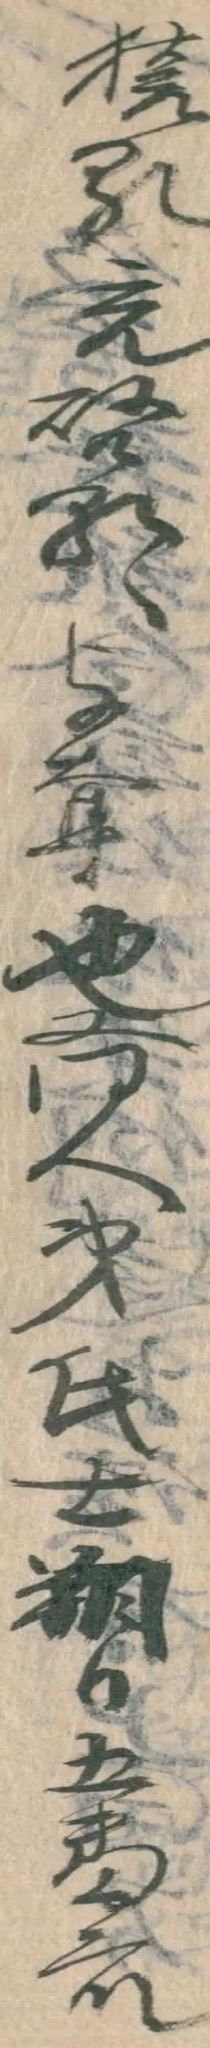撓類充質るへ与奪也同人弟氏士朔日五番衆
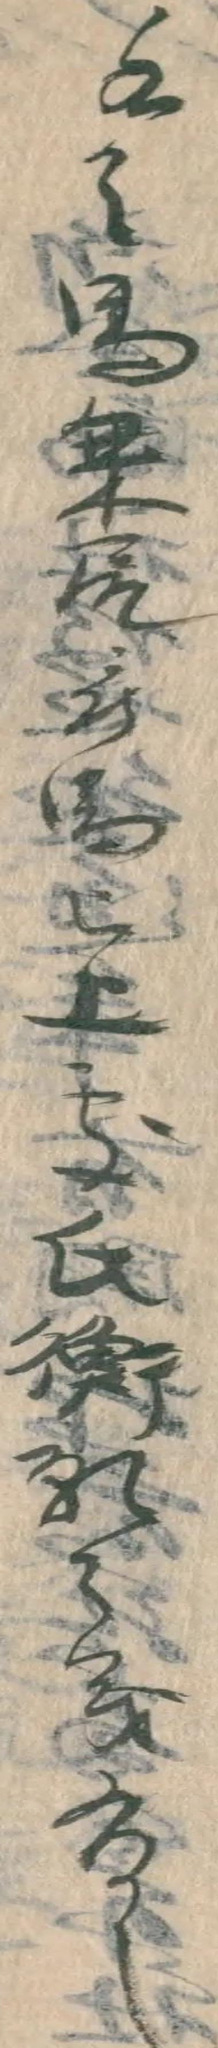分之馬乗尻ニ付馬被上処氏衡頼之義有之

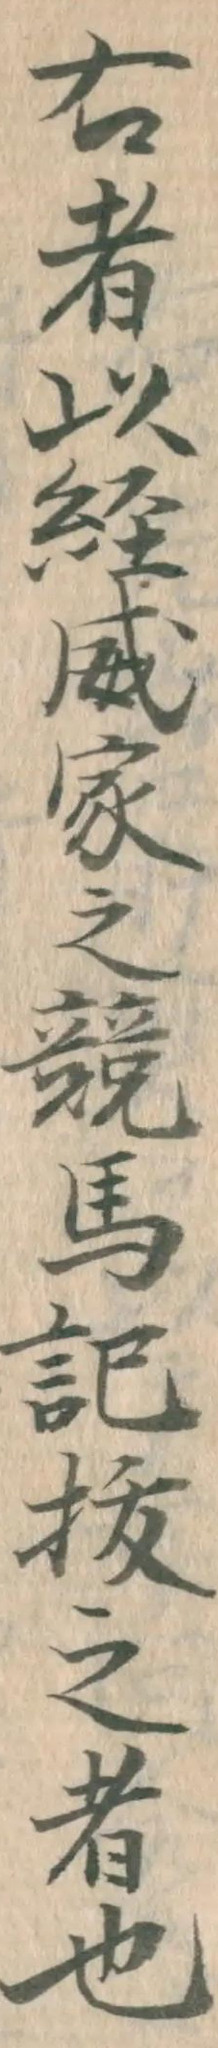右者以経威家之競馬記抜之者也
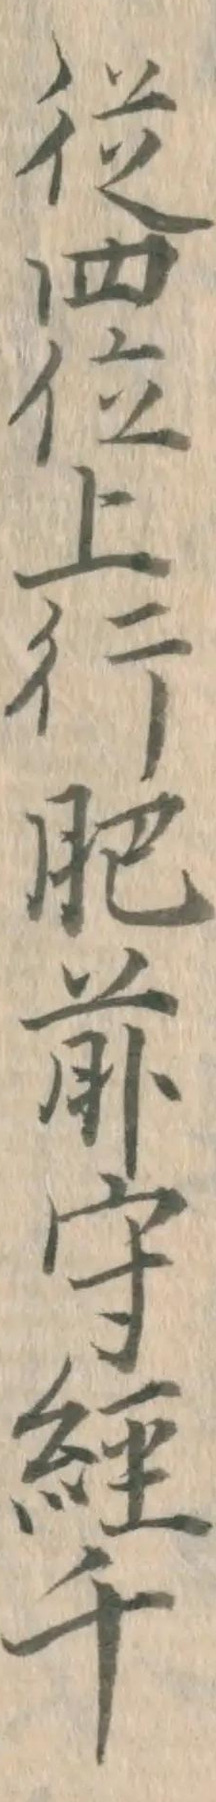従四位上行肥前守経千
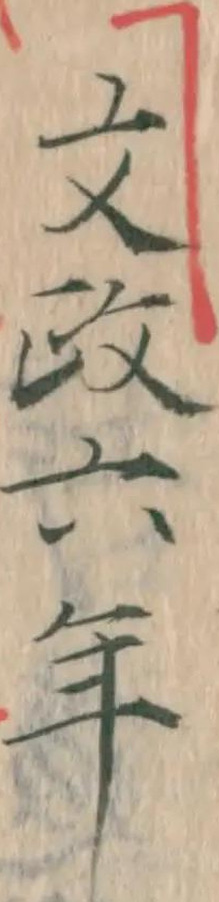文政六年
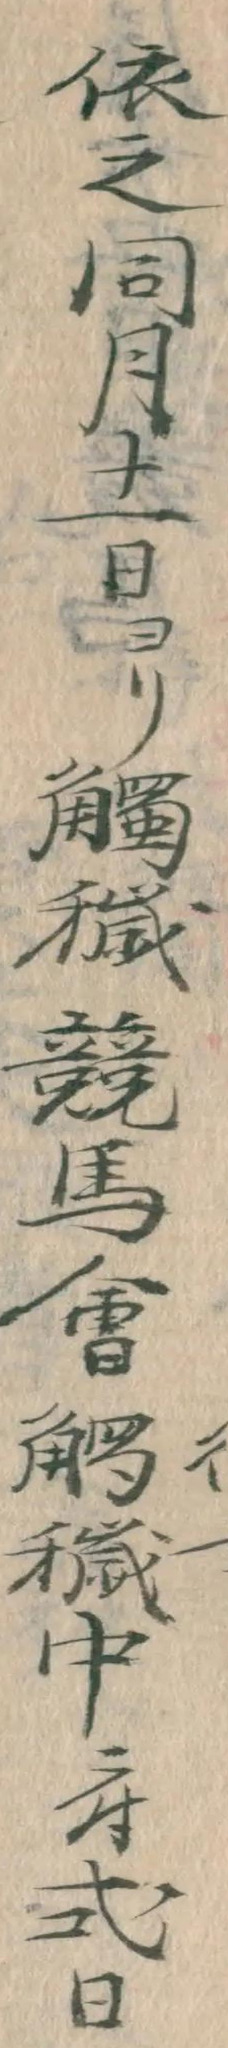依之同月十一日ヨリ触穢競馬会触穢中ニ付式日
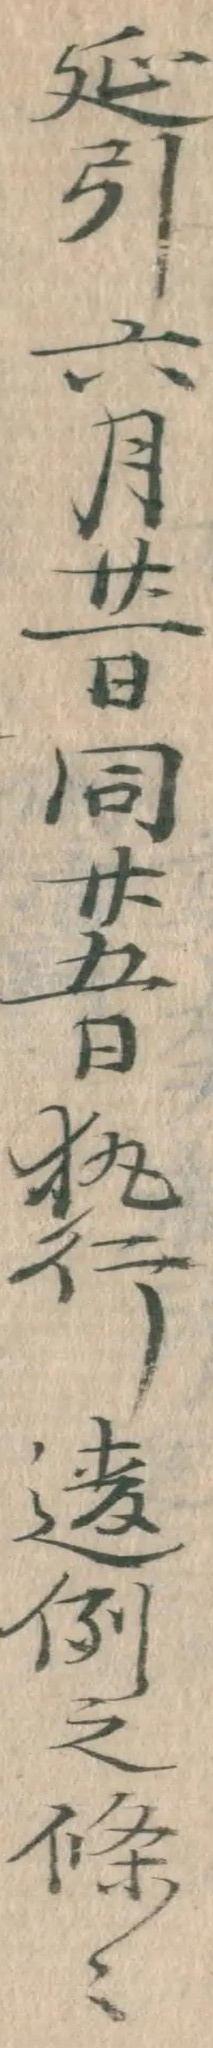延引六月廿一日同廿五日執行違例之条々
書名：賀茂社記録. 第10冊
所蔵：国立国会図書館 National Diet Library, JAPAN
